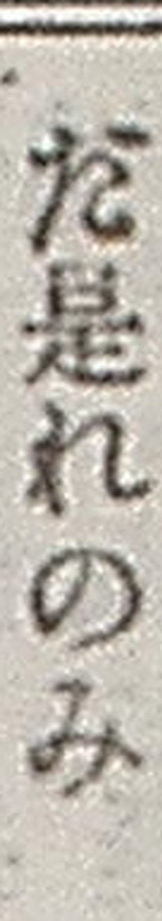だ是れのみ
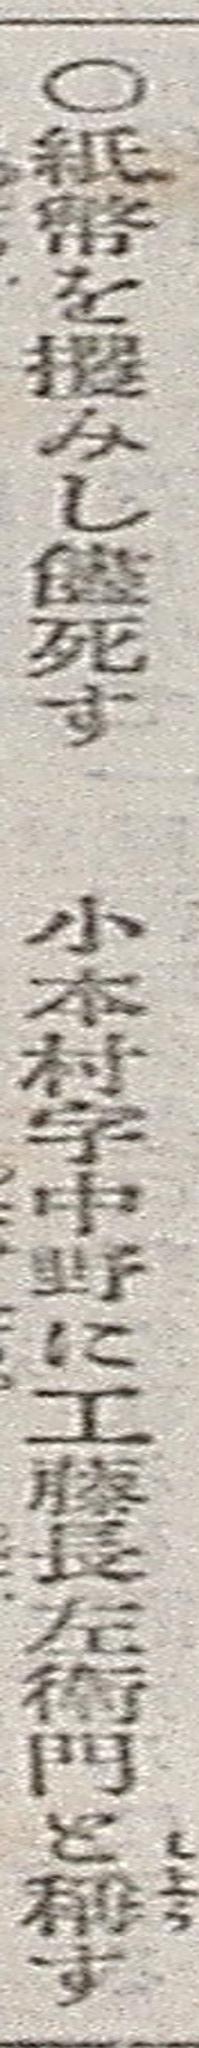○紙幣を攫みし侭死す小本村字中野に工藤長左衛門と称す
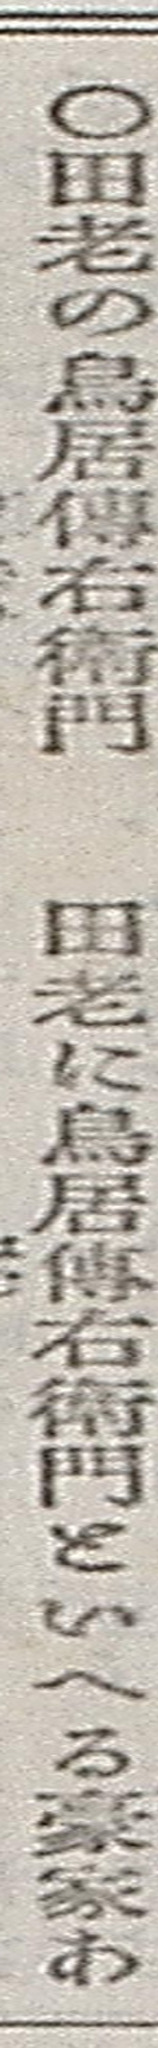○田老の鳥居伝右衛門田老に鳥居伝右衛門といへる豪家あ
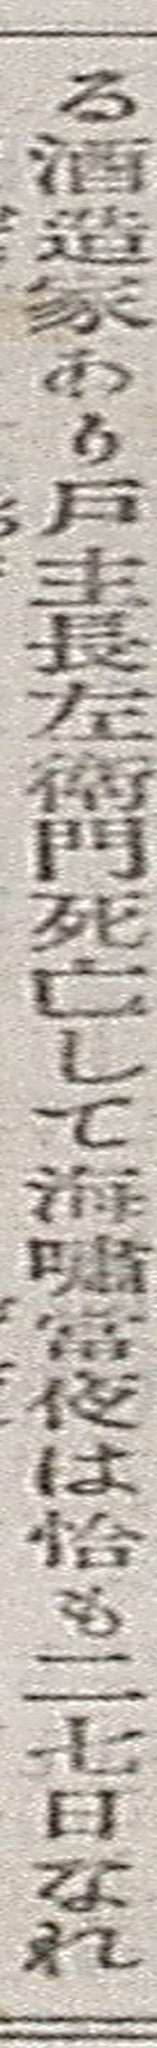る酒造家あり戸主長左衛門死亡して海嘯当夜は恰も二七日なれ
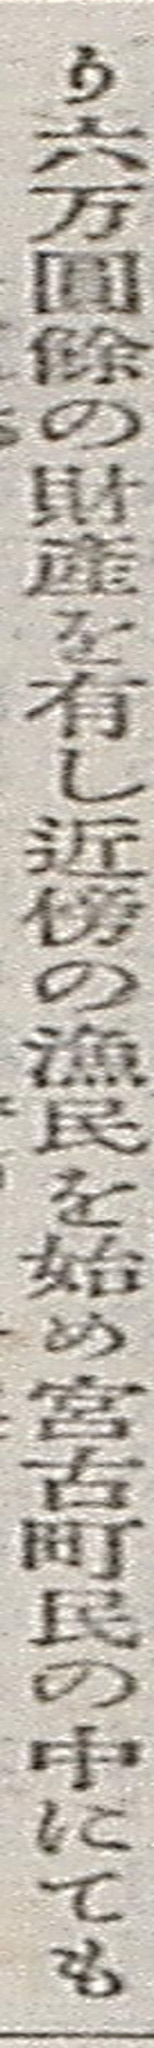り六万円余の財産を有し近傍の漁民を始め宮古町民の中にても
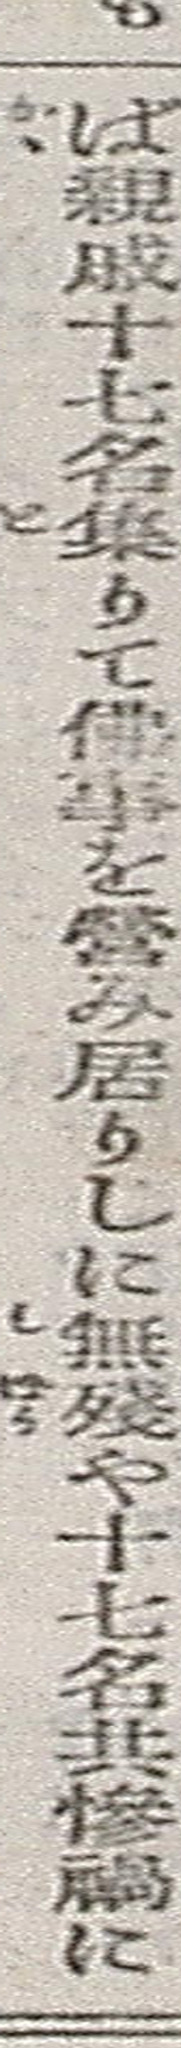ば親戚十七名集りて佛事を営み居りしに無残や十七名共惨禍に
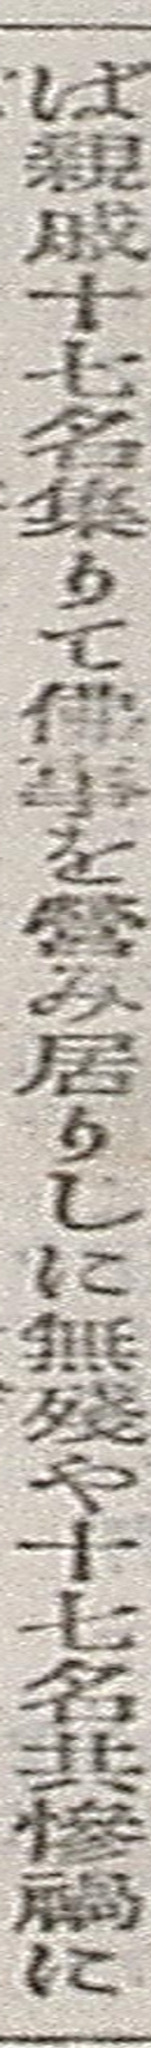ば親戚十七名集りて佛事を営み居りしに無残や十七名共惨禍に
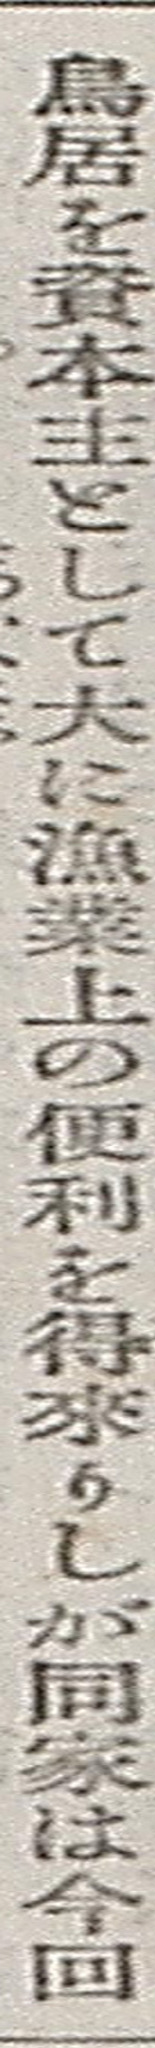鳥居を資本主として大に漁業上の便利を得来りしが同家は今回
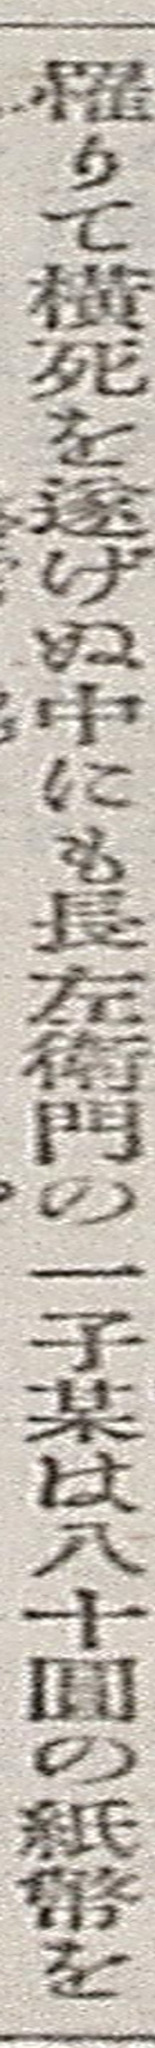罹りて横死を遂げぬ中にも長左衛門の一子某は八十円の紙幣を
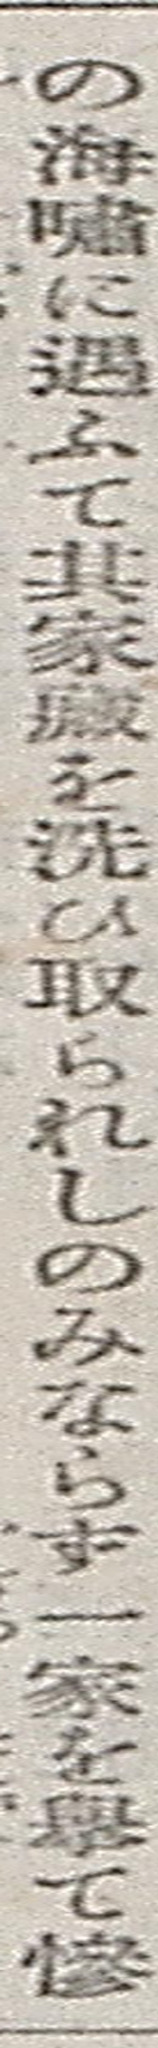の海嘯に遇ふて其家蔵を洗ひ取られしのみならず一家を挙て惨
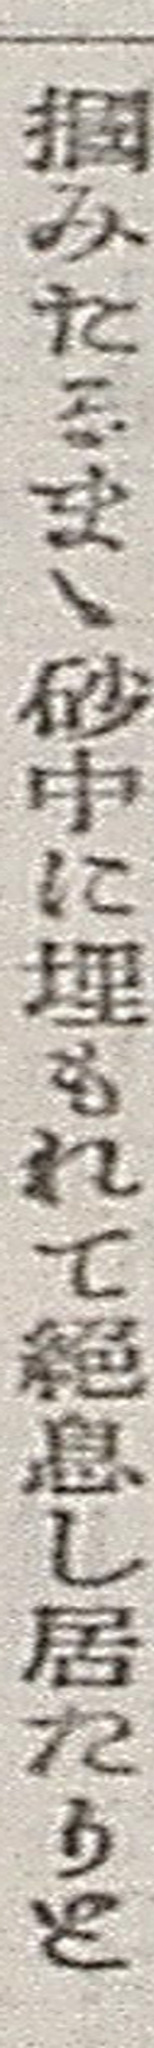掴みたるまゝ砂中に埋もれて絶息し居たりと
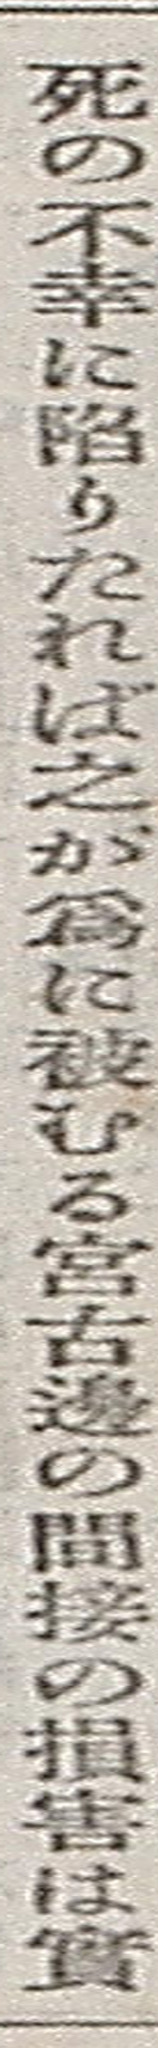死の不幸に陥りたれば之が為に被むる宮古辺の間接の損害は実
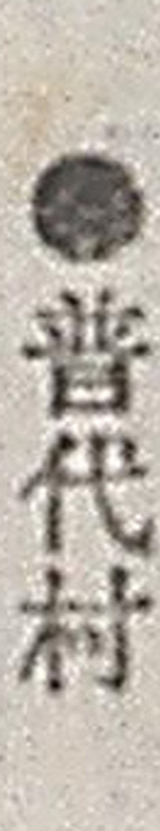●普代村
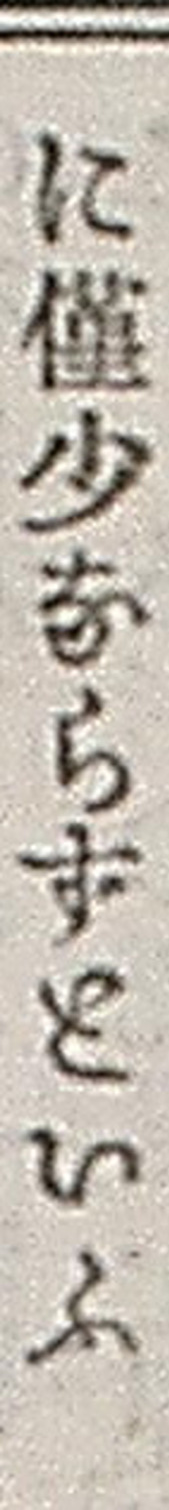に僅少ならずといふ
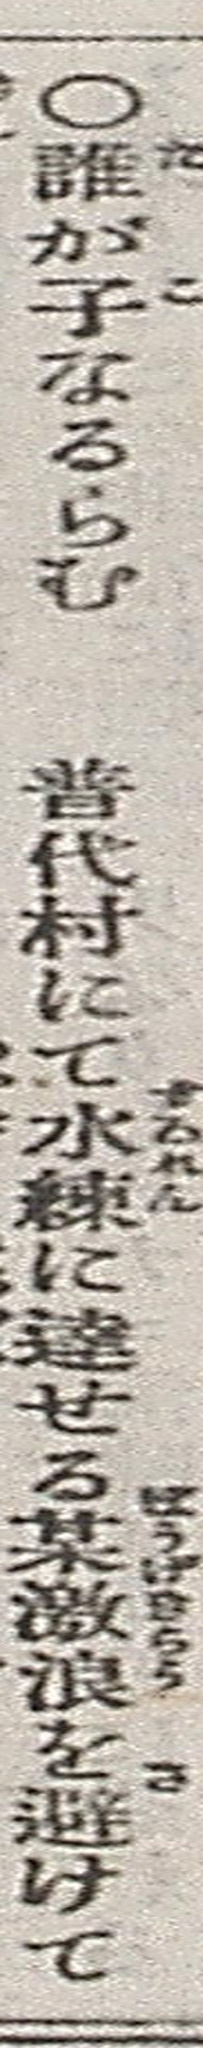○誰が子なるらむ普代村にて水練に達せる某激浪を避けて
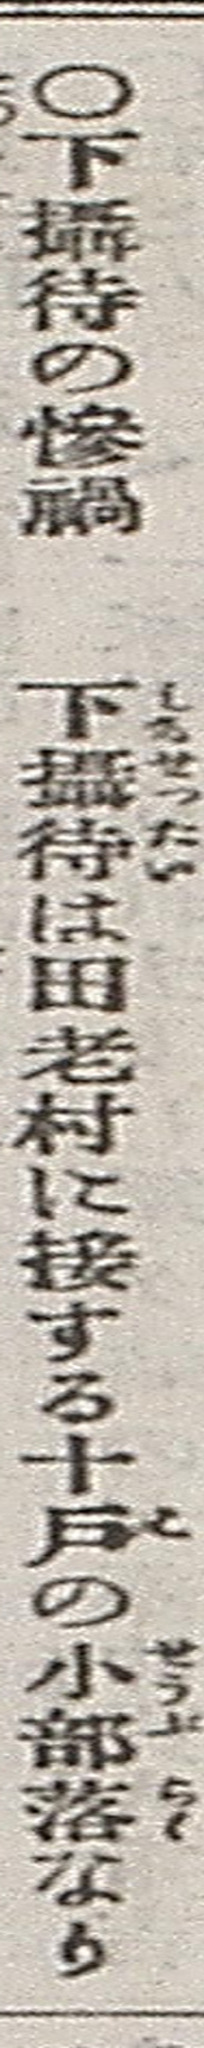○下摂待の惨禍下摂待は田老村に接する十戸の小部落なり
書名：風俗畫報臨時増刊第百二十號　大海嘯被害録（下）
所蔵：東京大学地震研究所図書室 Earthquake Research Institute Library, The University of Tokyo, JAPAN
